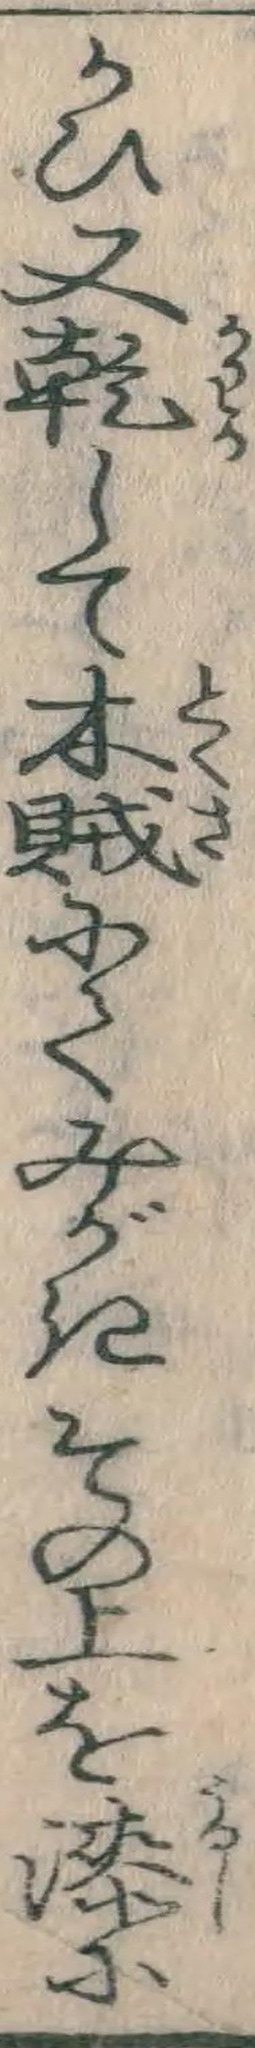かひ又乾して木賊にてみがきその上を漆に
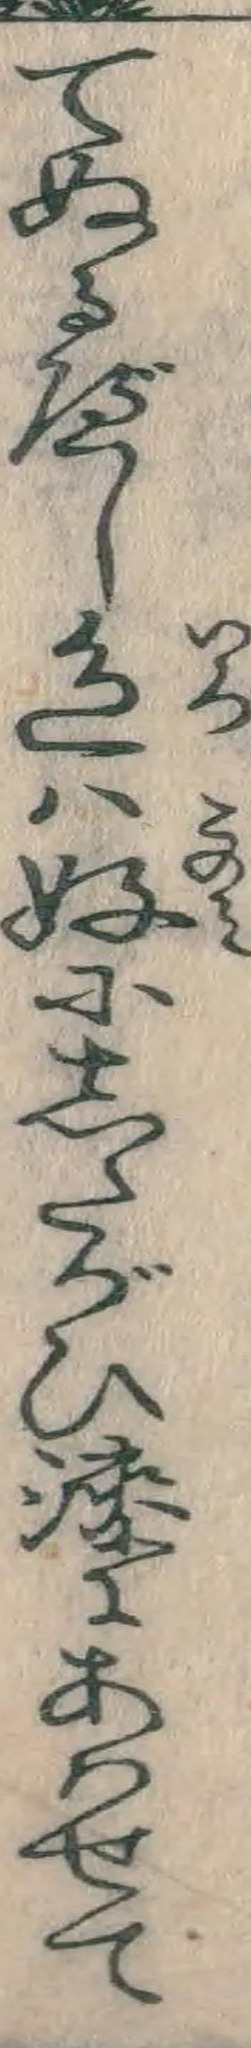てぬるべし色は好にしたがひ漆にあはせて
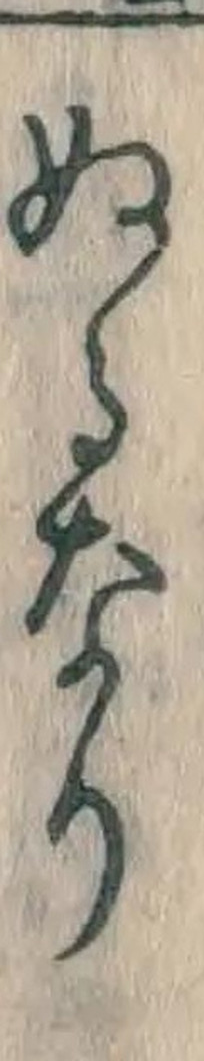ぬるなり
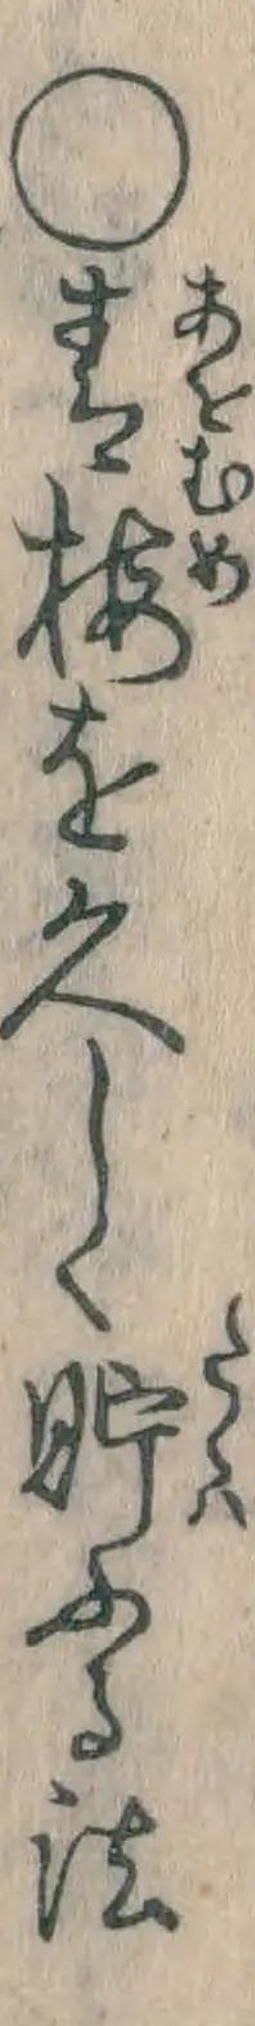○青梅を久しく貯ふる法
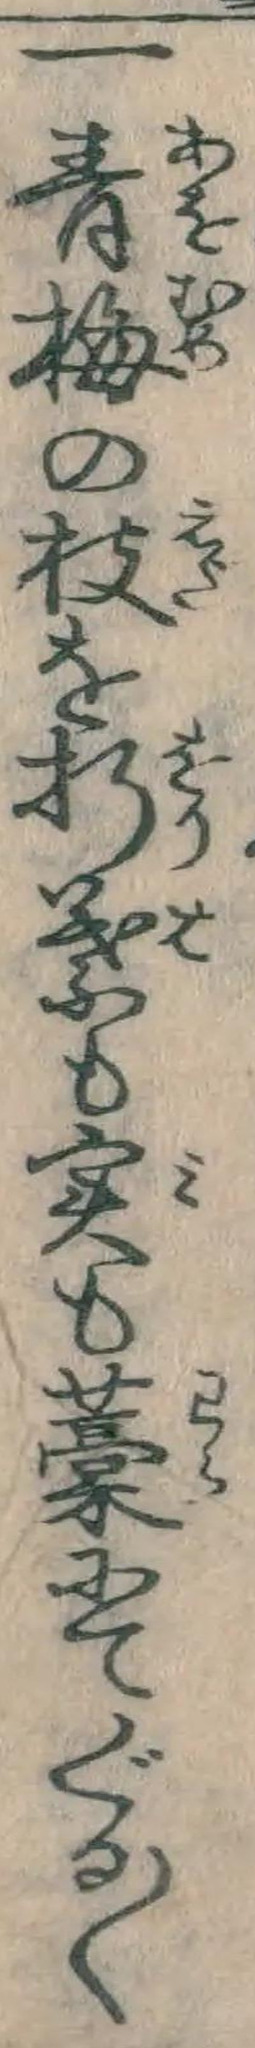一青梅の枝を折葉も実も藁にてぐる〳〵

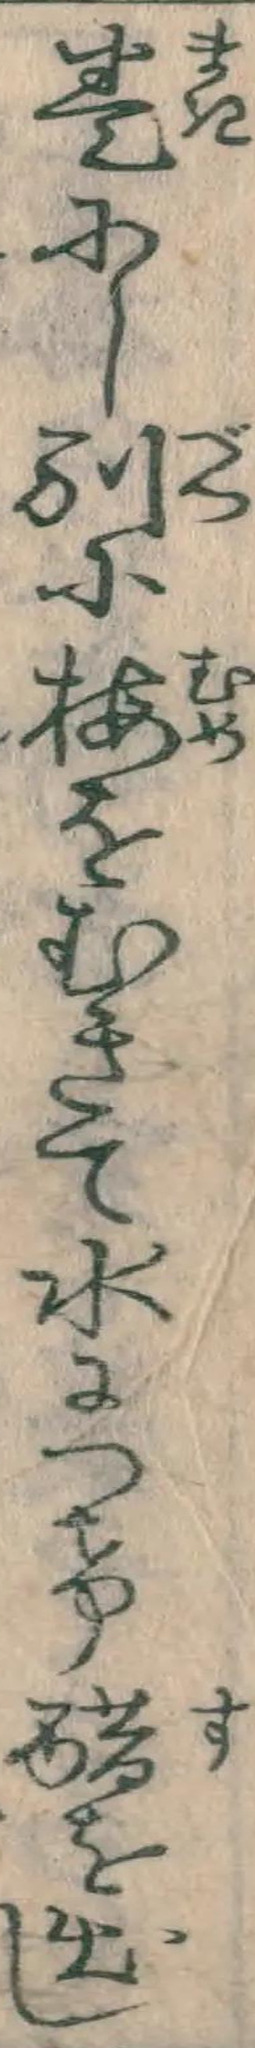巻にし別に梅をむきて水につけ醋を出し
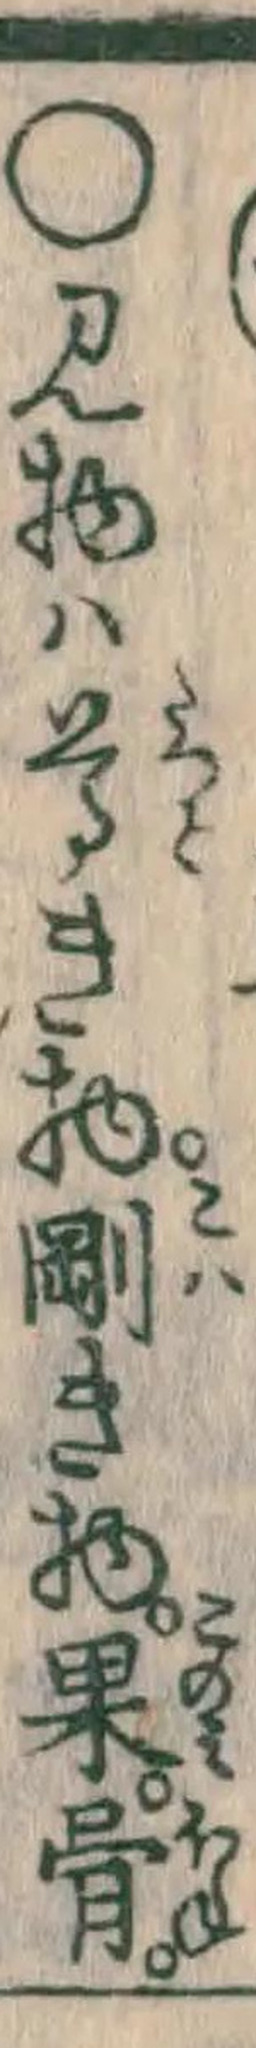○見物は尊き物。剛き物。果。骨。
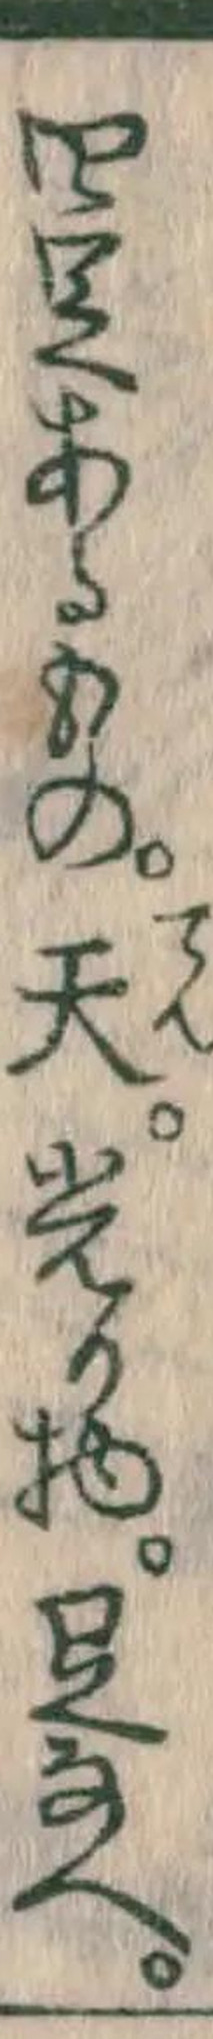四足あるもの。天。光り物。足なへ。
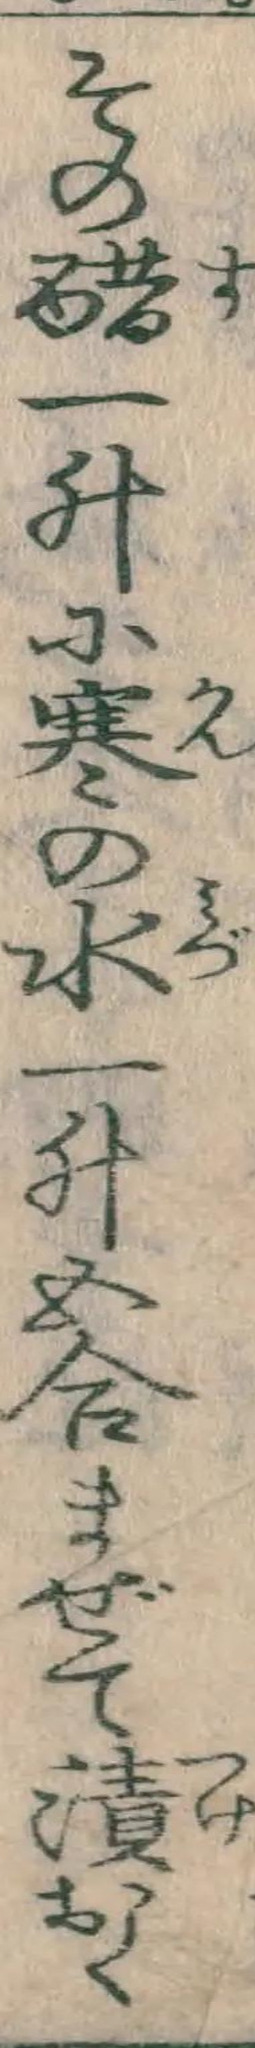その醋一升に寒の水一升五合まぜて漬おく
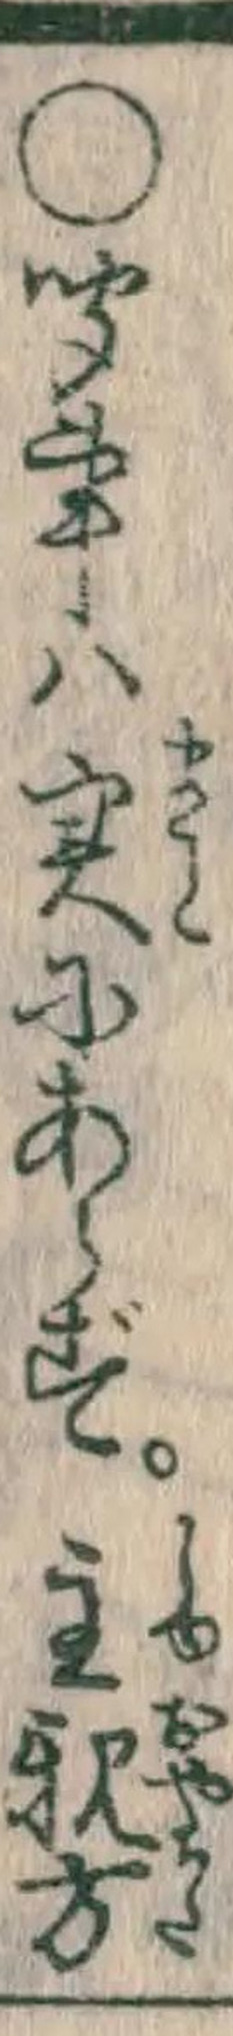○聞事は実にあらず。主親方
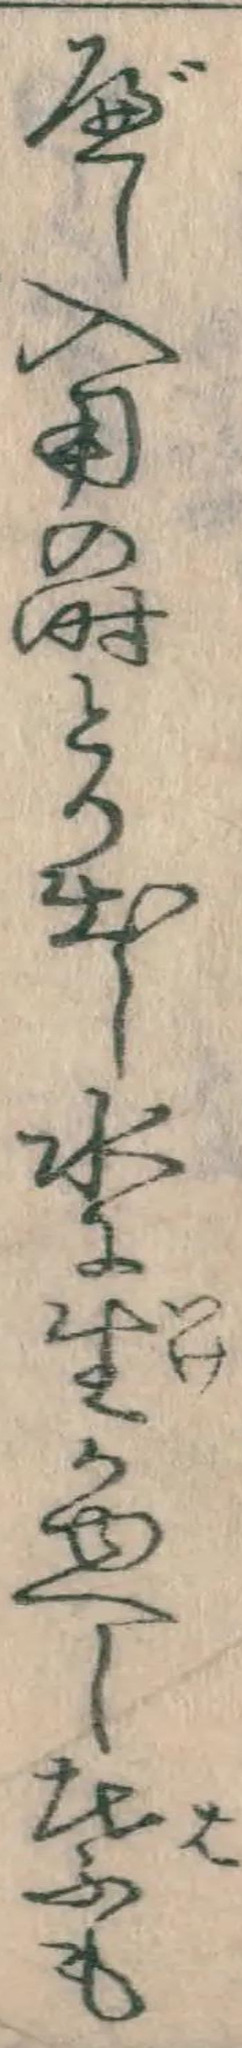べし入用の時とり出し水に生かゆへし葉も
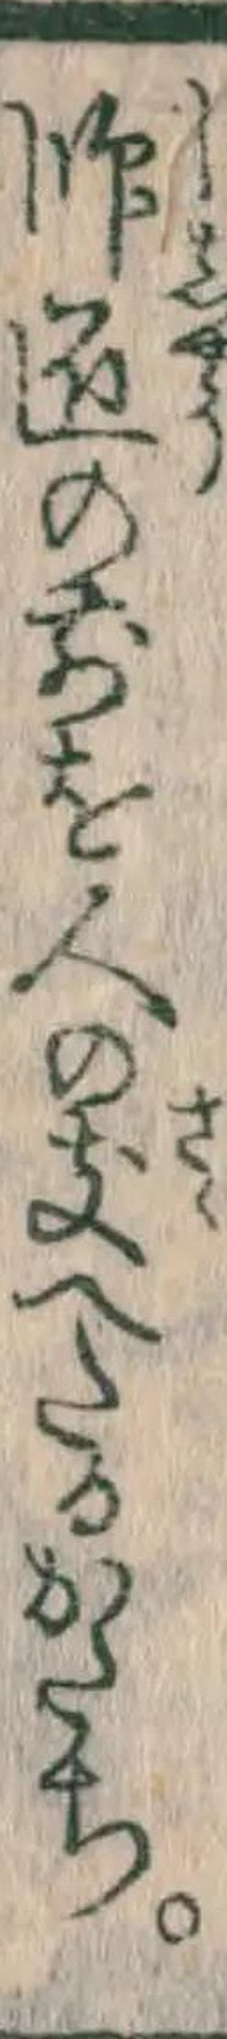師匠の前を人の支へたるかたち。
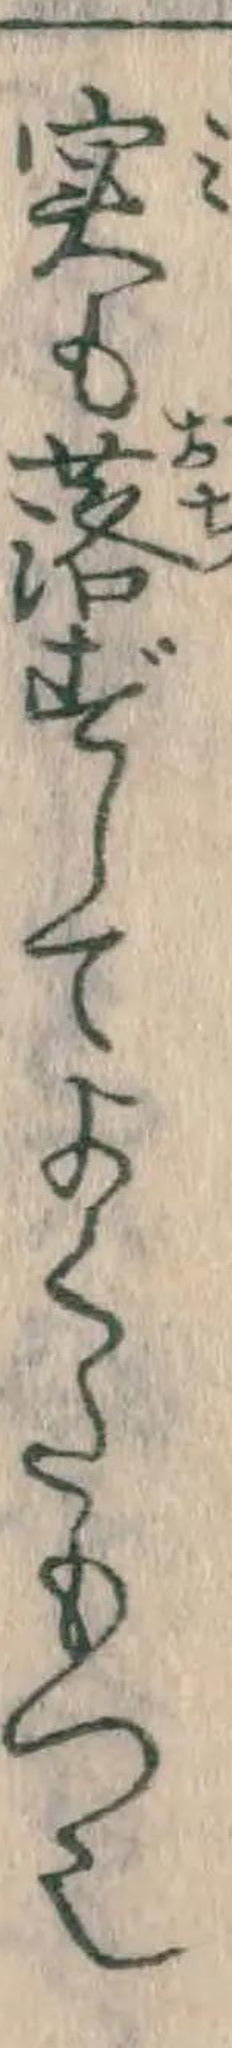実も落ずしてよくたもつ也
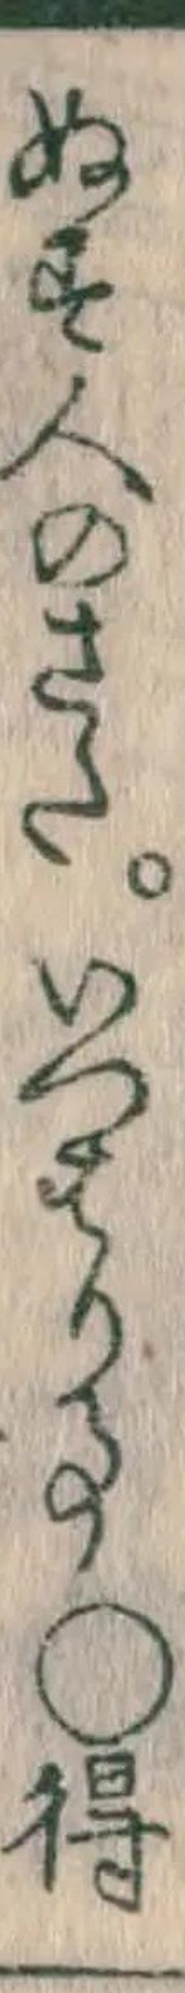ぬす人のさた。いつはり事○得
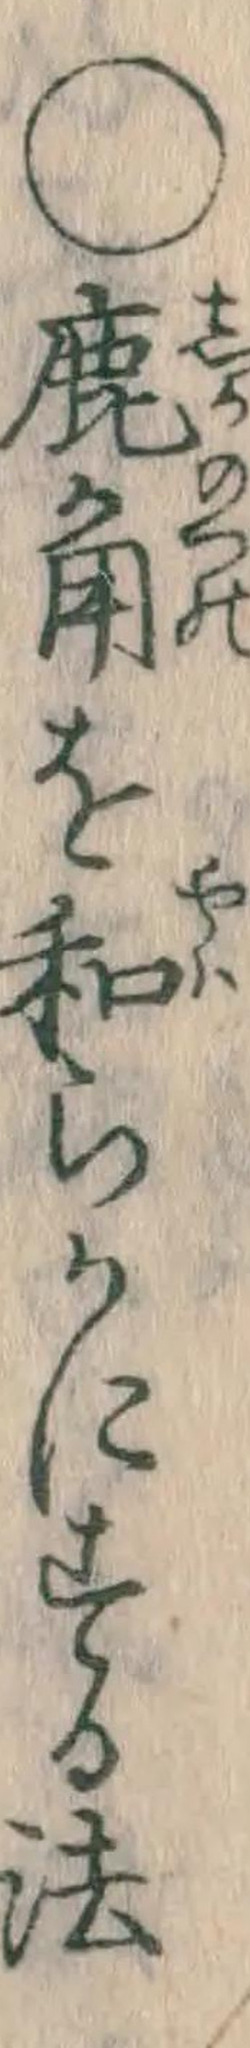○鹿角を和らかにする法
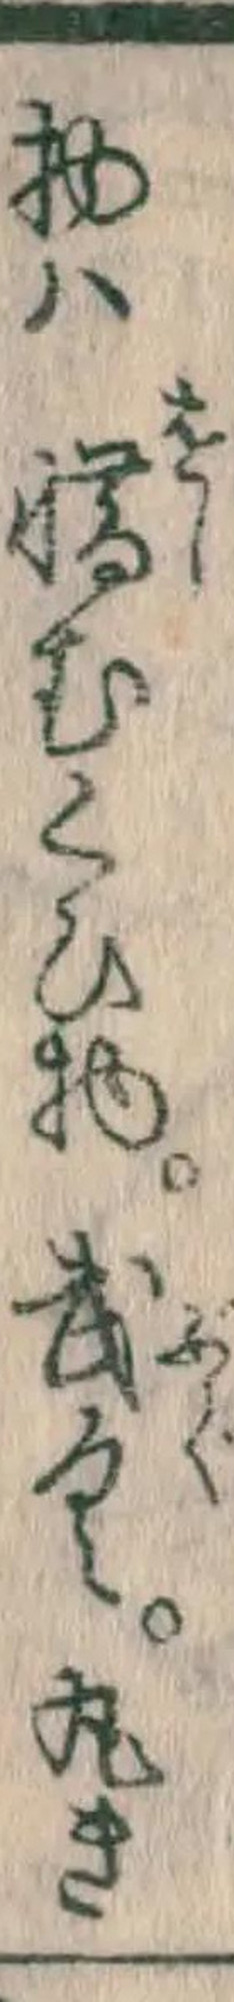物は惜むくひ物。武具。丸き
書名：広益秘事大全 3巻. [1]
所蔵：国立国会図書館 National Diet Library, JAPAN
